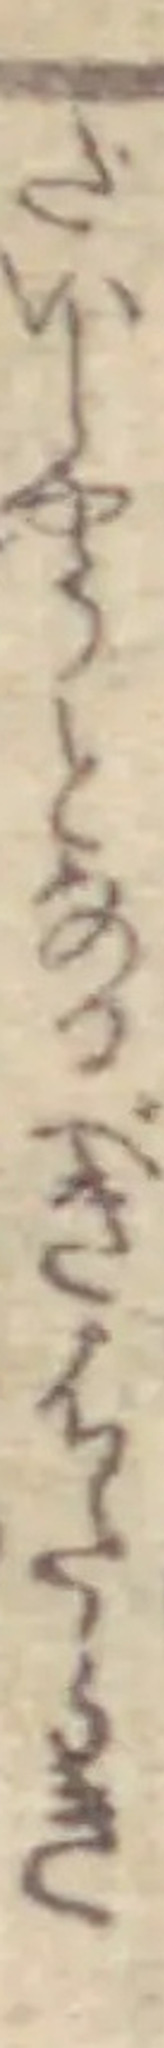だいしやうとなるべきはたらき
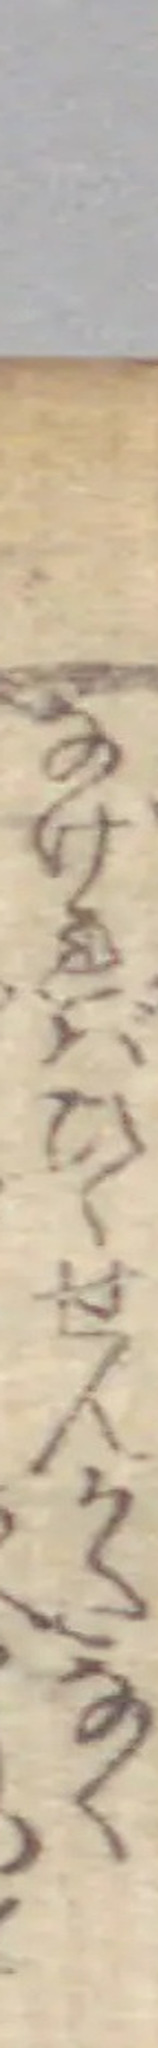なければひゝせんかたなく
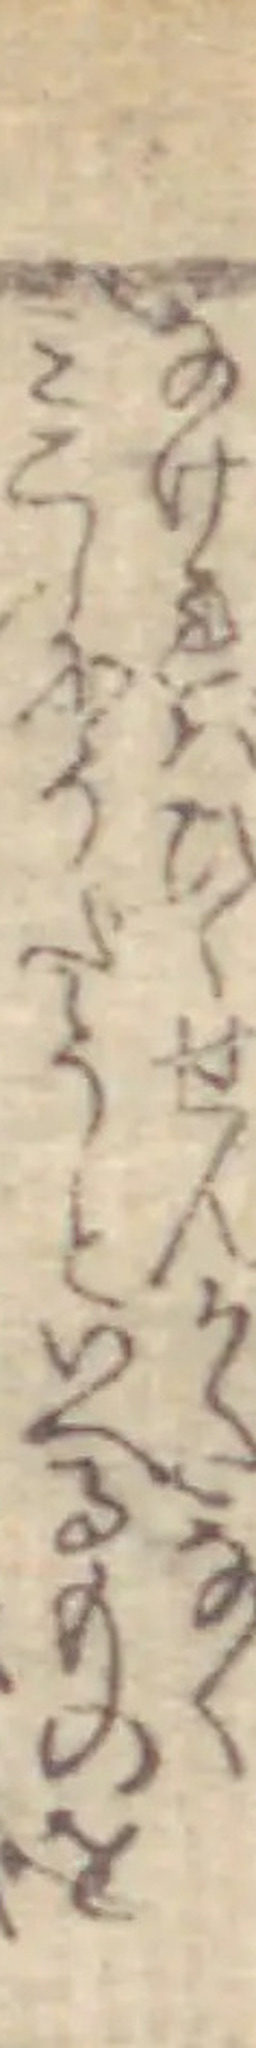みこしにうだうといへるものを
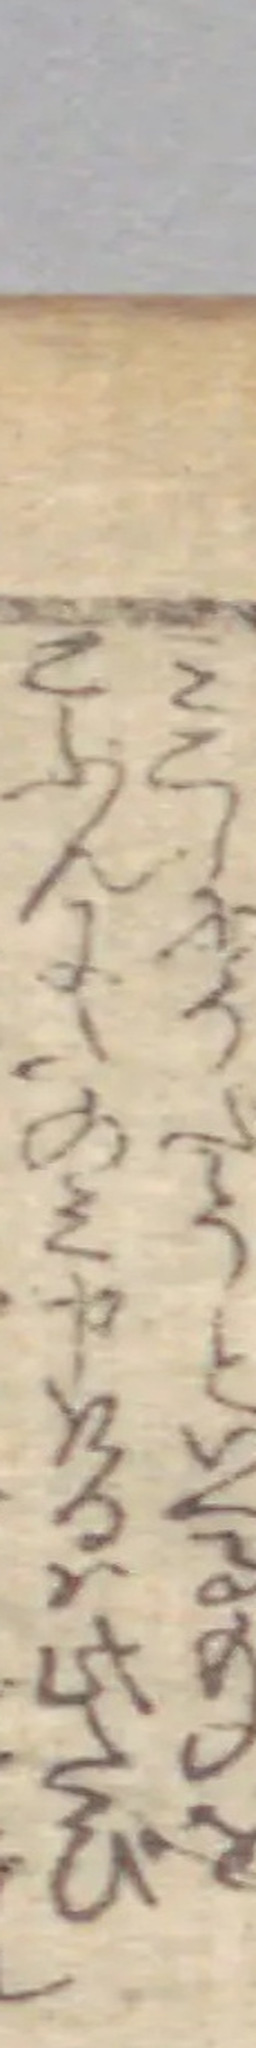こぶんにたのみ申けるは此たび
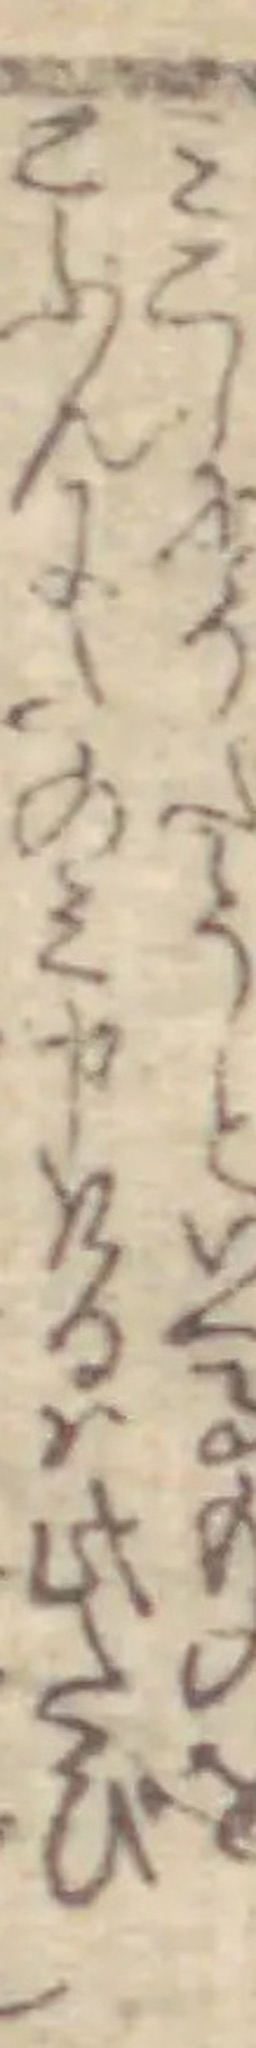こぶんにたのみ申けるは此たび
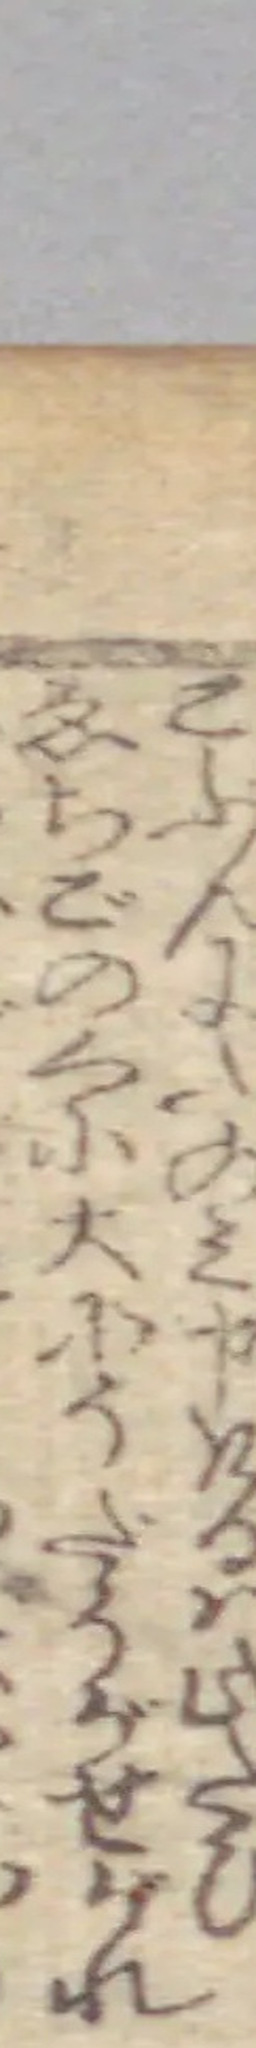ゑちごのくに大にうだうがせがれ
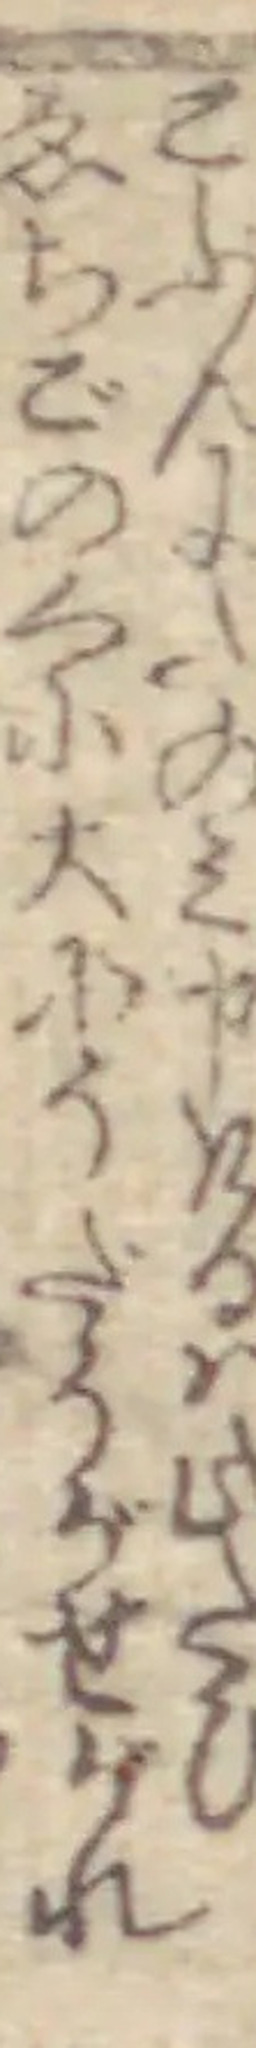ゑちごのくに大にうだうがせがれ
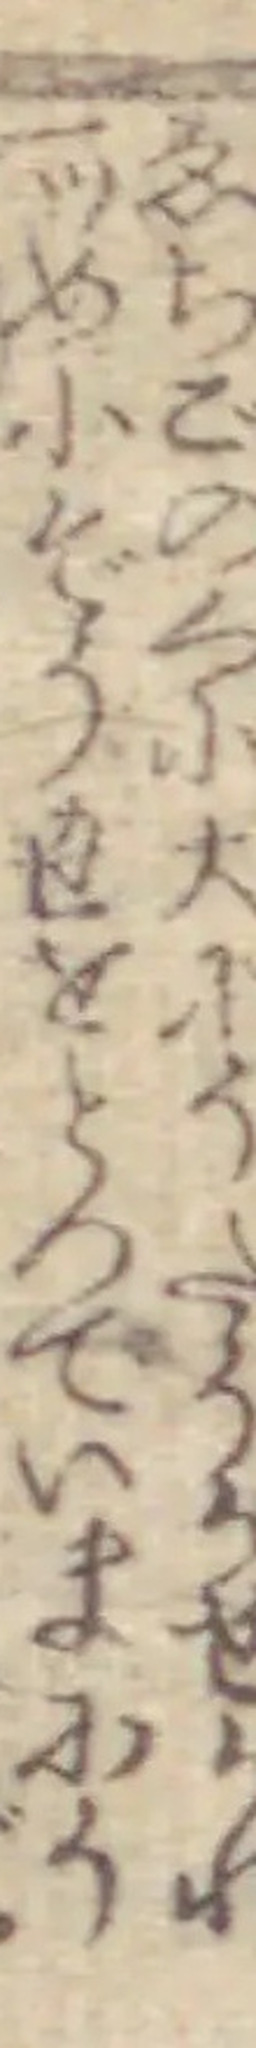一つめ小ぞう世をとつていまにう
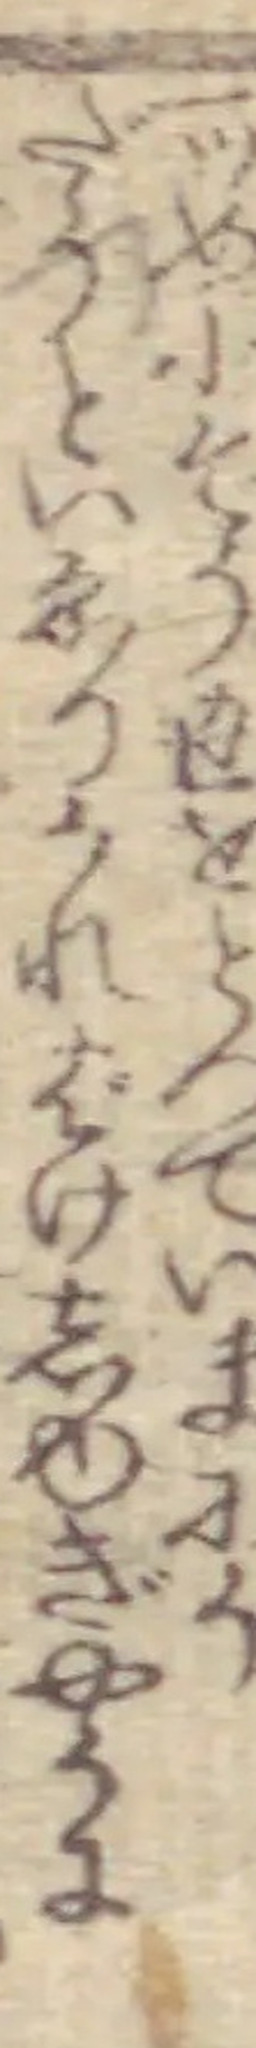たうといゑりかればけしゆぎやうに
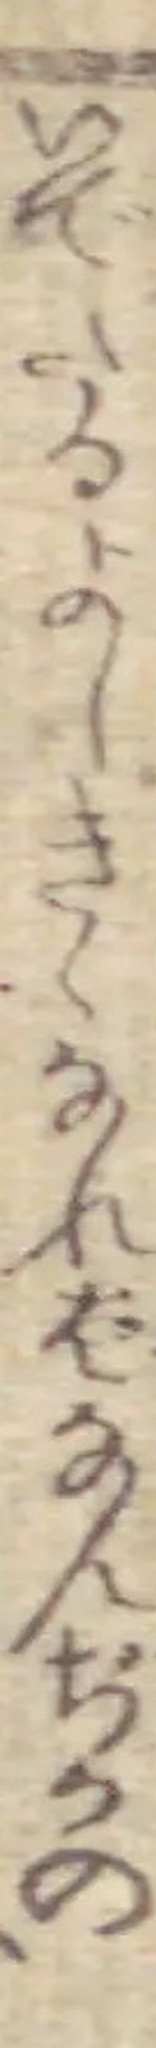いでたるよしきゝなればなんぢかの
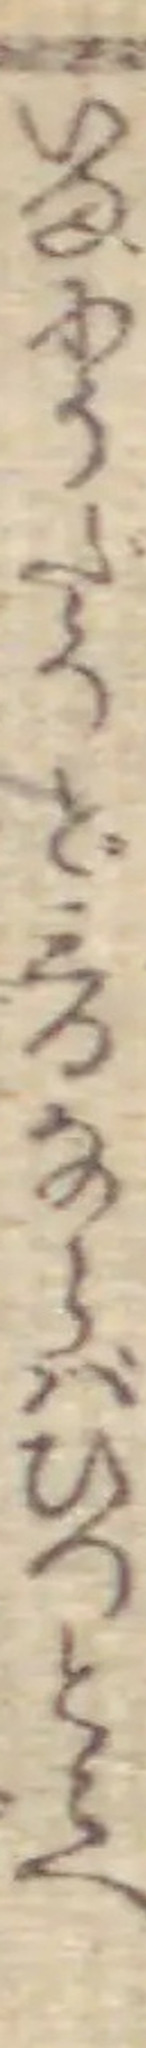いまにうだうとみるならばひつとらへ
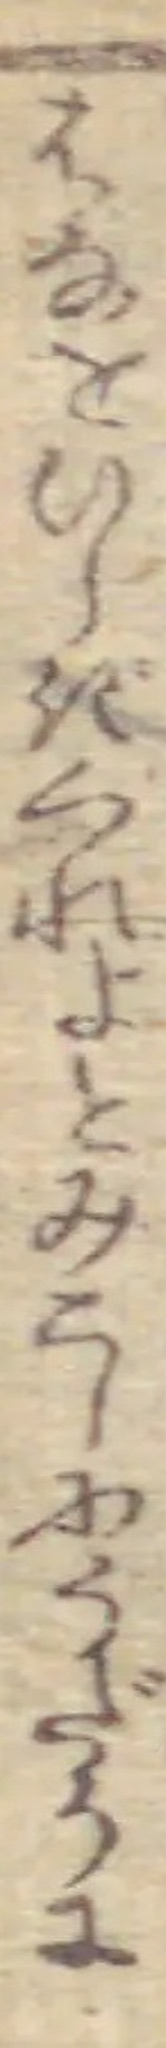はなをひしぎくれよとみこしびうだうに
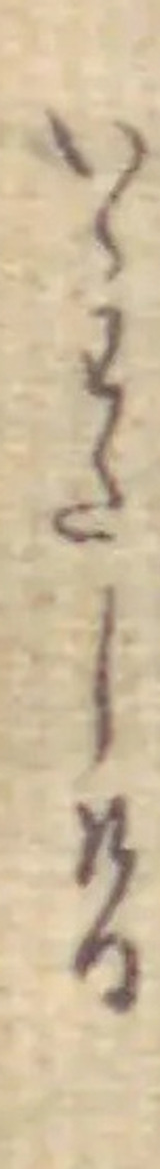いゝわたしける

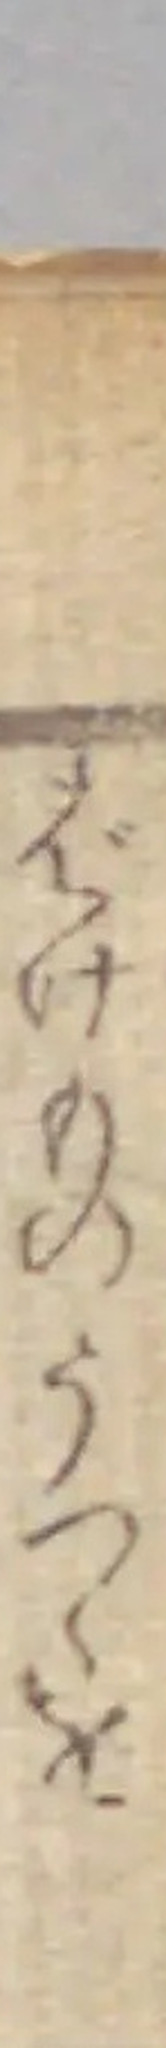ばけものうつゝを
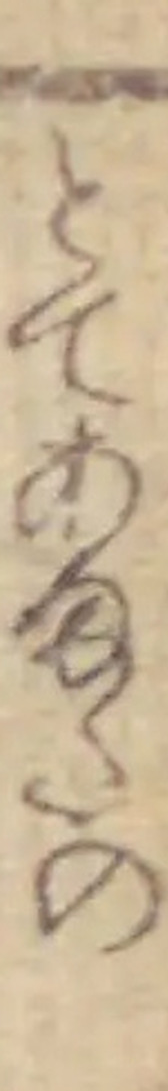とてあまたの
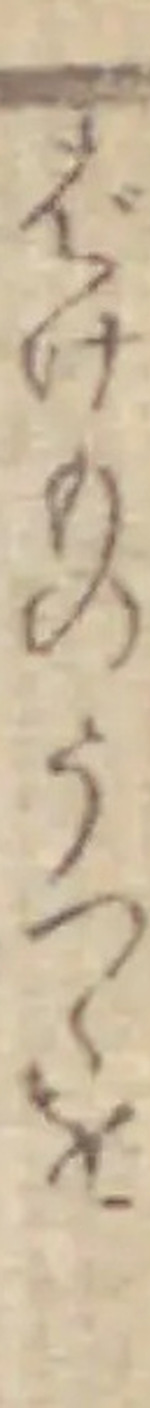ばけものうつゝを
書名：大昔化物双紙 2巻
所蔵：国立国会図書館 National Diet Library, JAPAN
